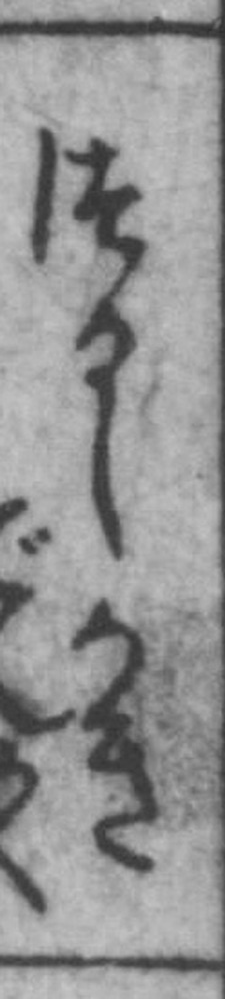つるしかき
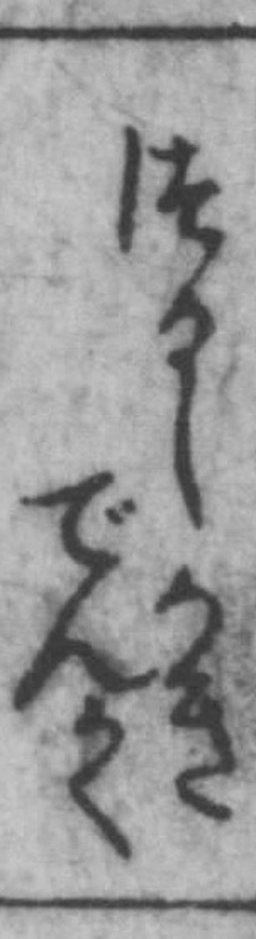でんかく
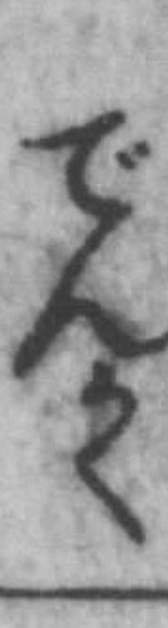でんかく
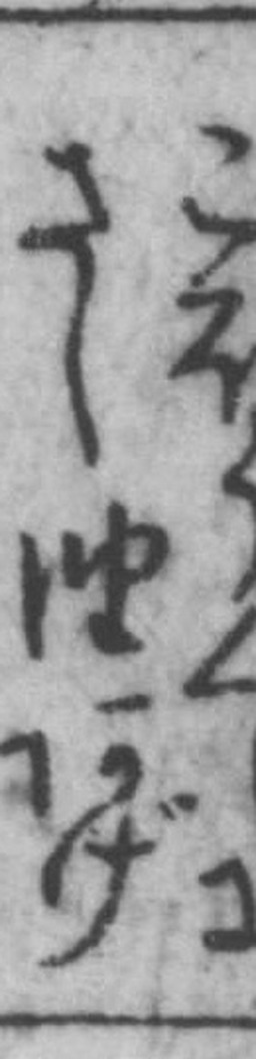さし油あげ
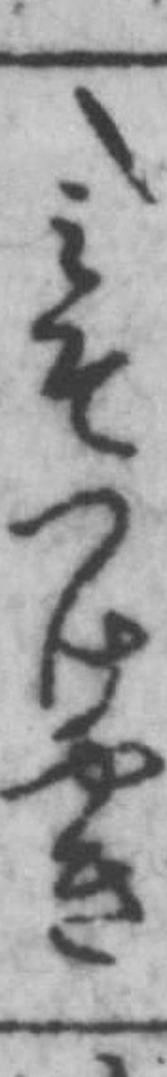ミそつけやき
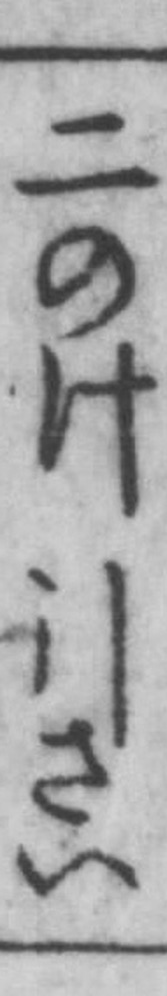二の汁引さい
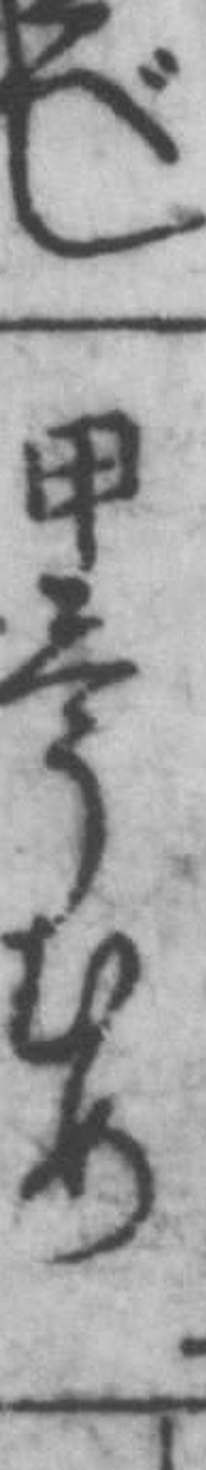甲しううめ
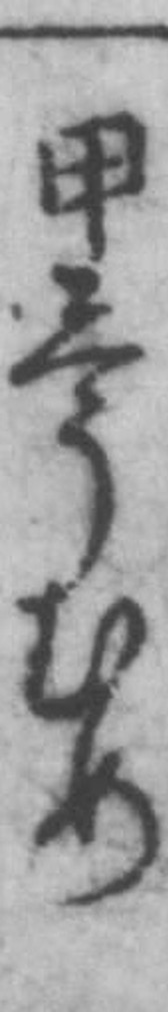甲しううめ
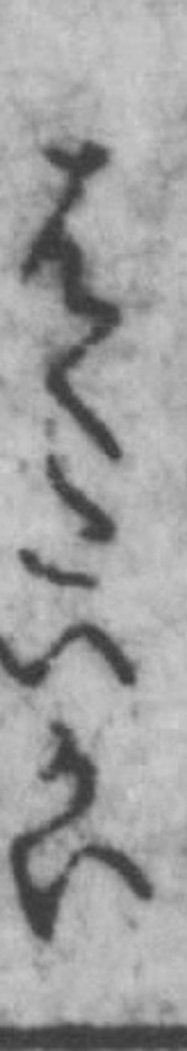はくたいかい
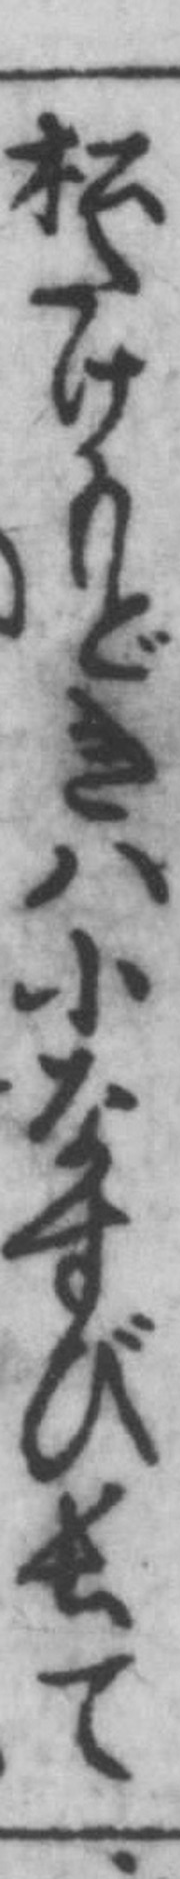松たけもどきハなすび長にて
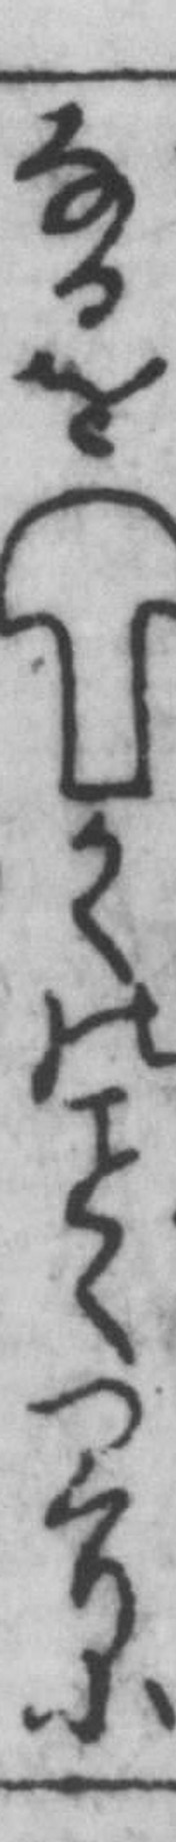なるをかくのことくつくり小
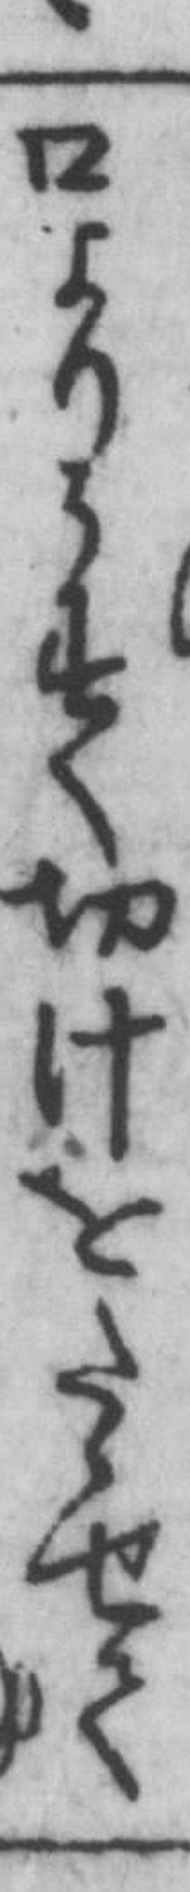よりうすく切汁をたゝせて
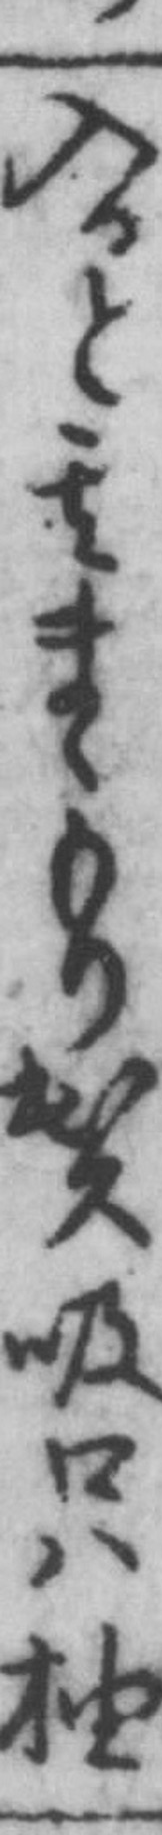入ると其まゝもり出す吸口ハ柚
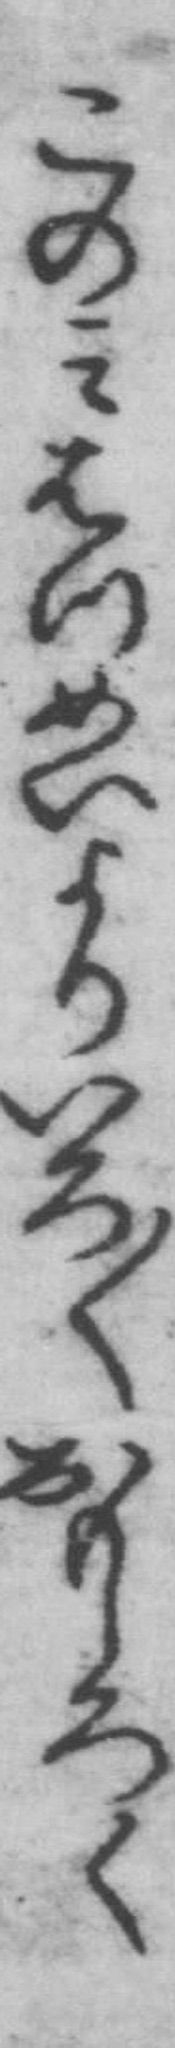このはつめいよりいろ〳〵おもしろく
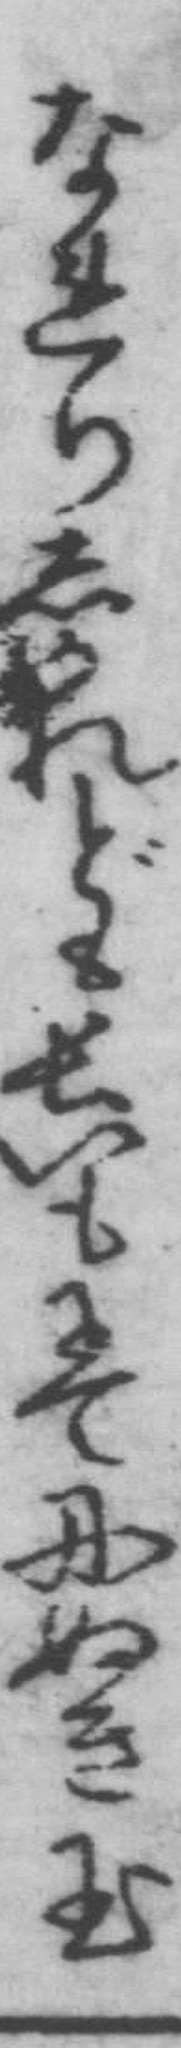取肴なれりしかれども長いもにてにぬき玉
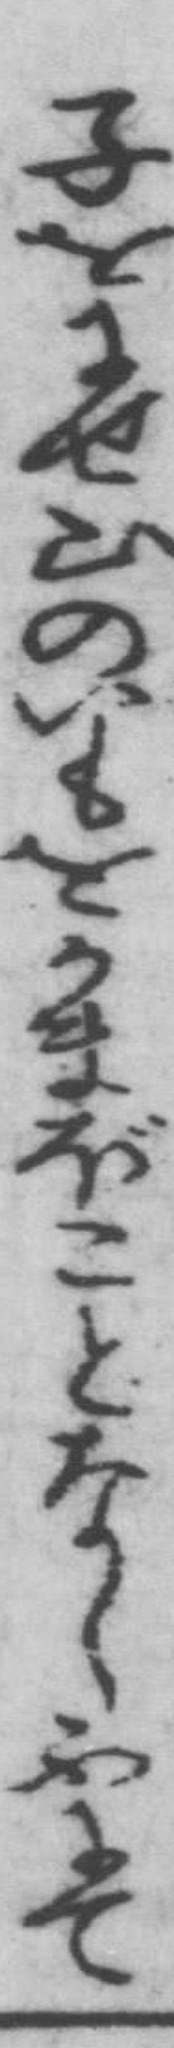子をよせ山のいもをかまぼことなしにて
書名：料理献立抄
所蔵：大阪府立大学学術情報センター 国文学研究資料館
